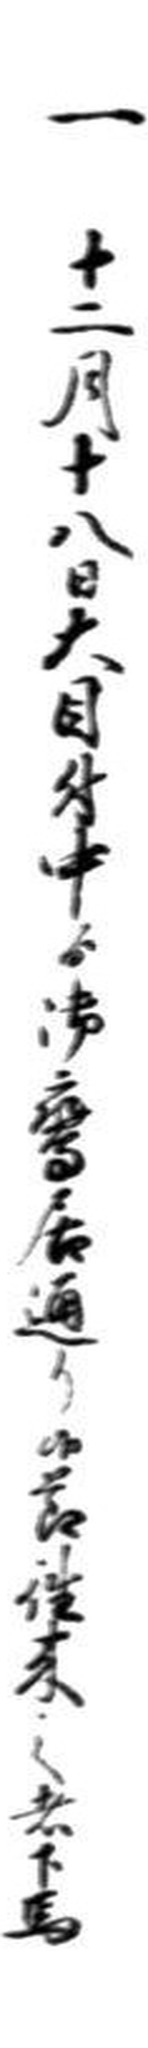一十二月十八日大目付中ゟ御鷹居通り候節往来之者下馬
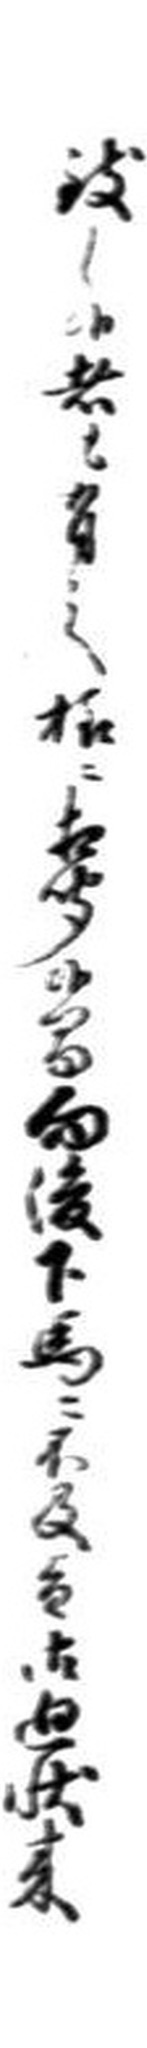致し候者も有之様ニ相聞候間向後下馬ニ不及旨御廻状来
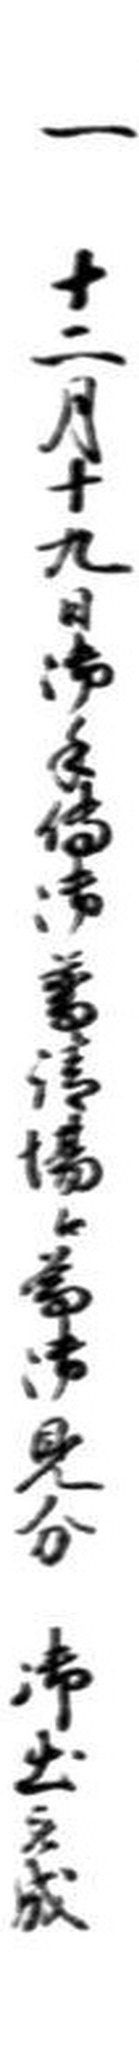一十二月十九日御手伝御普請場江為御見分御出被成
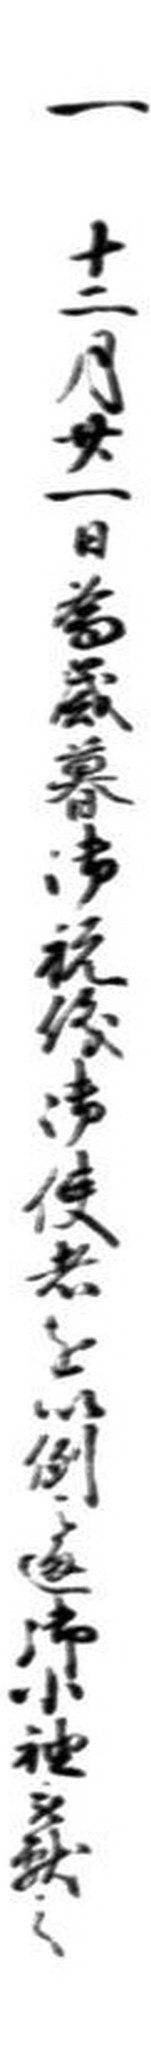一十二月廿一日為歳暮御祝儀御使者を以例之通御小袖被献之
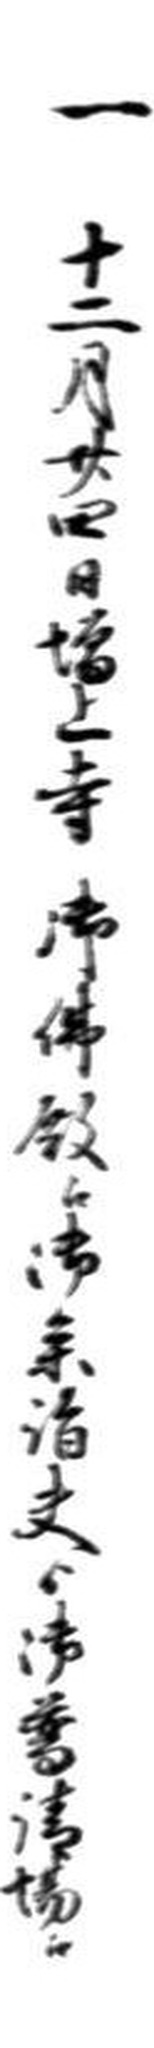一十二月廿四日増上寺御仏殿江御参詣夫ゟ御普請場江
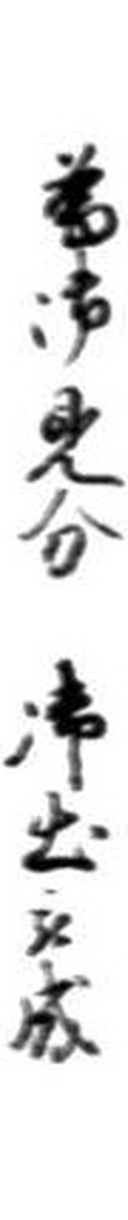為御見分御出被成
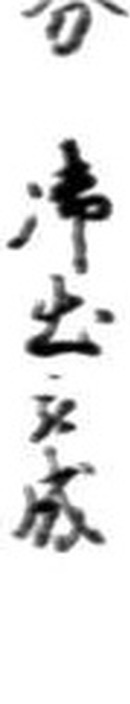御出被成
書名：家譜 三十一 吉邦公 享保元年
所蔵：福井県文書館 Fukui Prefectural Archives
